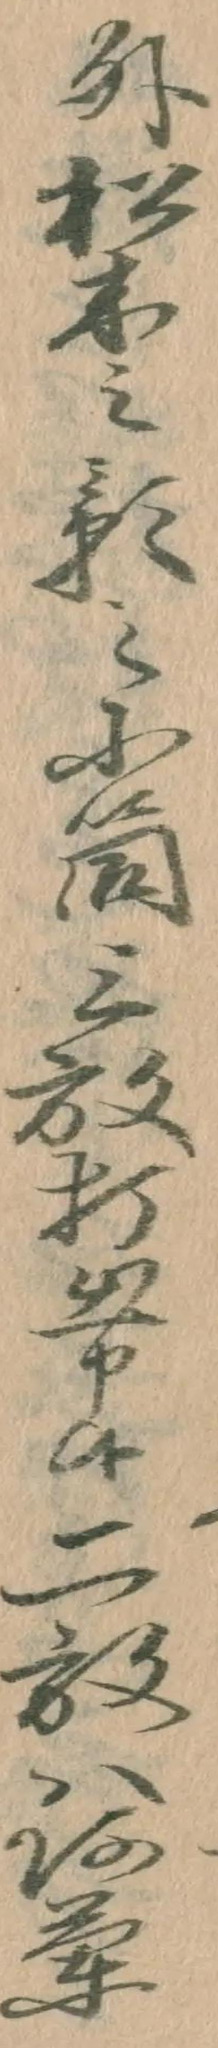外松木之類之小筒三放打出申候二放は阿蘭
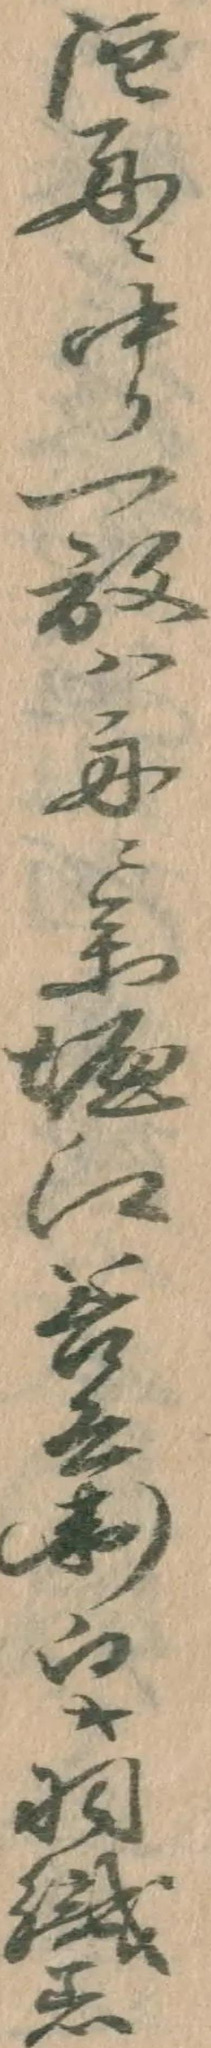陀舟に中り一放は舟に参堀江善兵衛白き羽織着
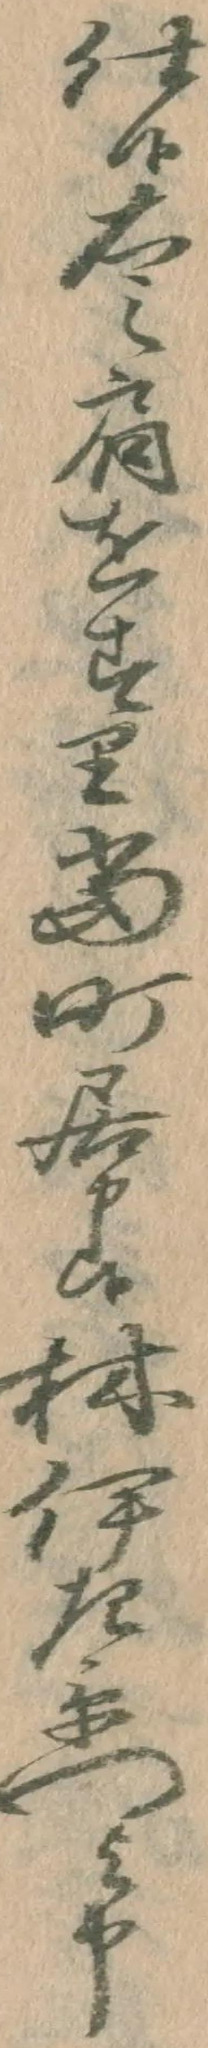仕候右之肩を春里当町居申候林伊左衛門与申
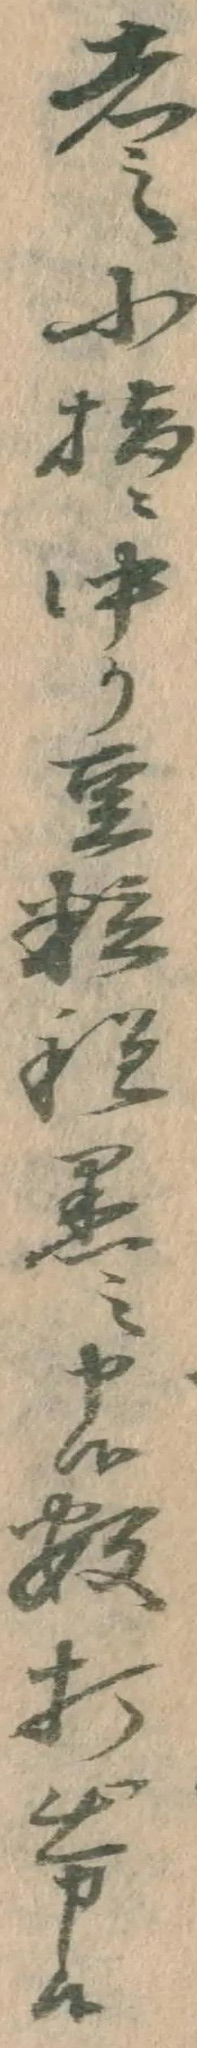者之小指に中り豆粒程黒之申候数打出申候
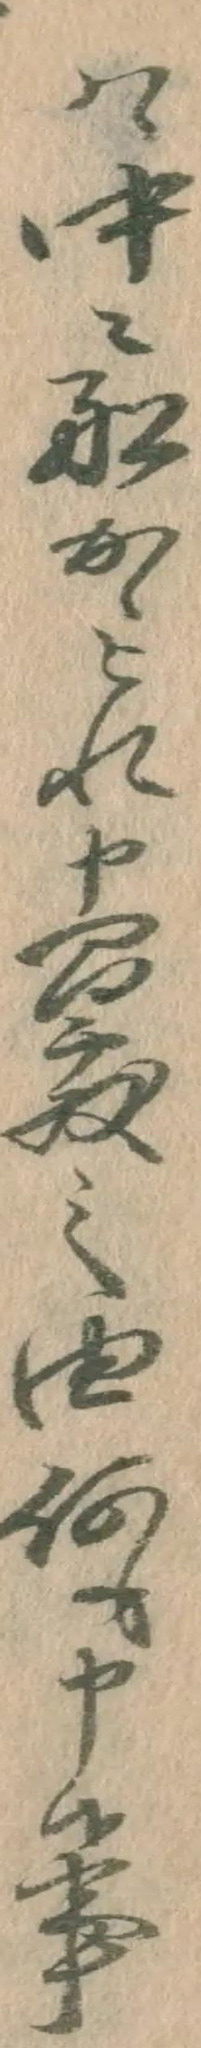はゝ中々舩かゝられ申間敷之由何も申候事
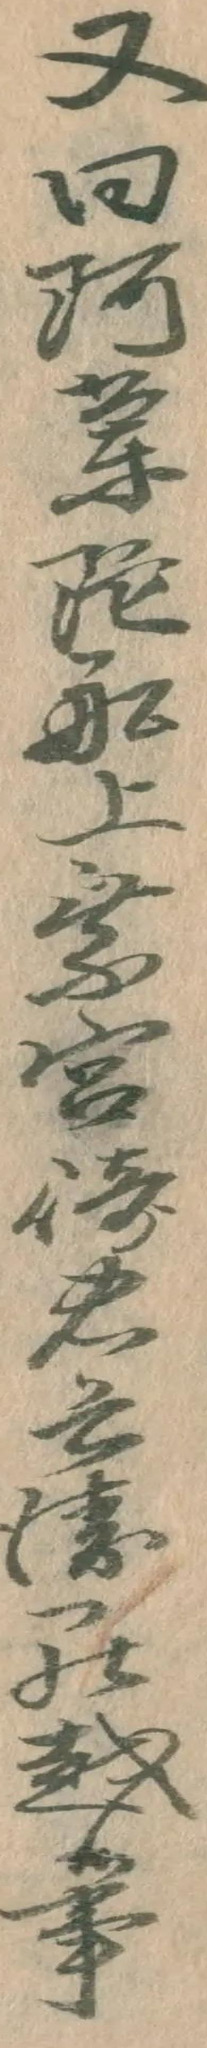又曰阿蘭陀舩上乗宮崎忠兵衛罷越候事
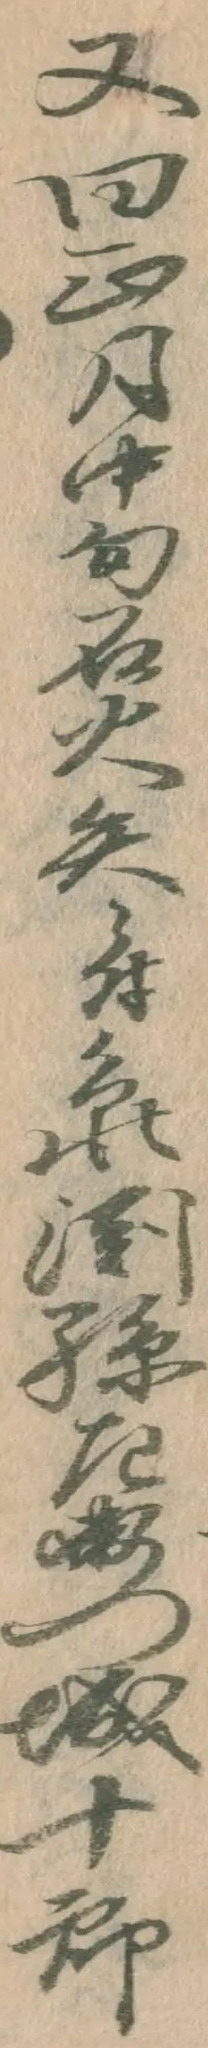又曰正月中旬石火矢に付亀渕孫左衛門城十郎
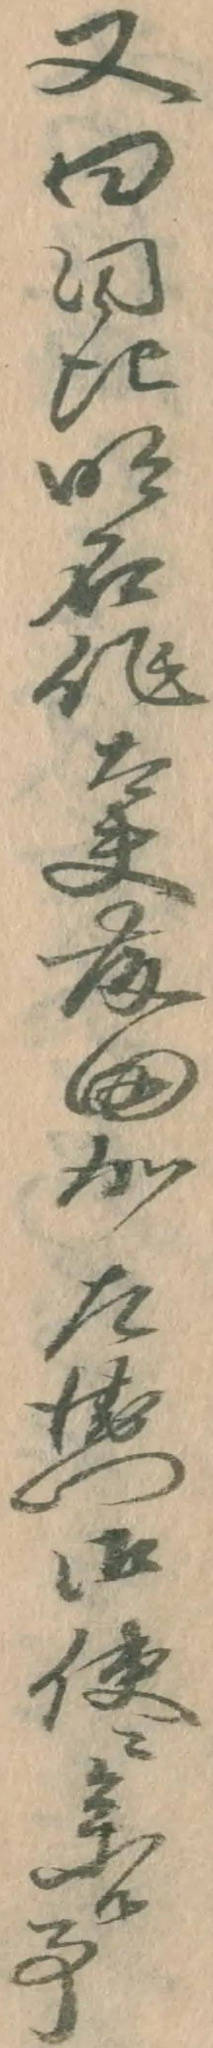又曰同比明石作太夫藤田加左衛門御使に参候事

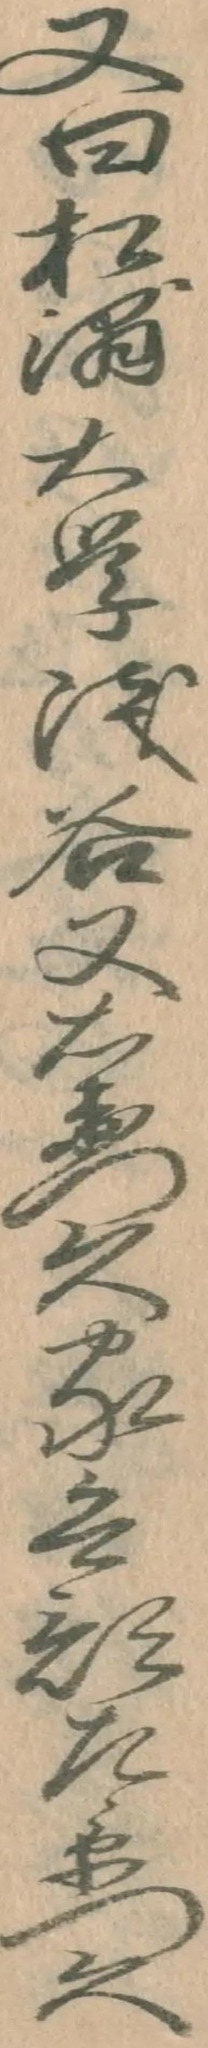又曰松浦大学浅谷又右衛門久家兵部左衛門久
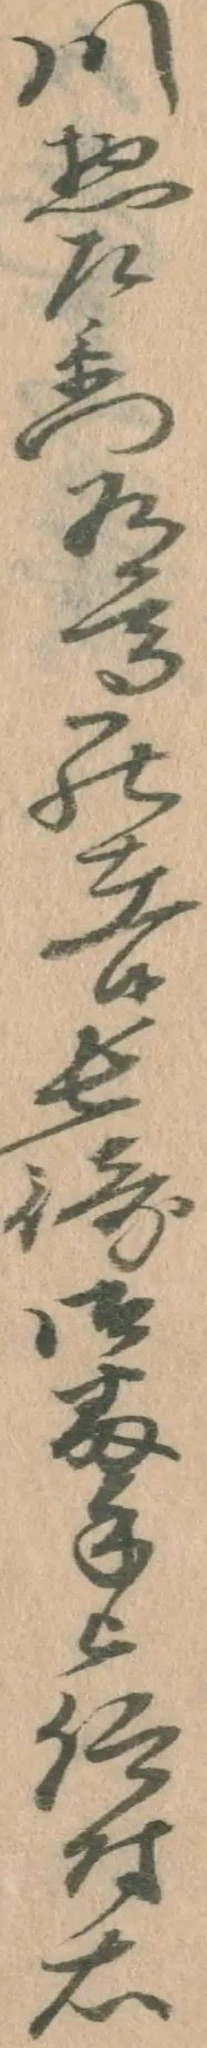川惣左衛門有馬罷在候長崎御番手被仰付右
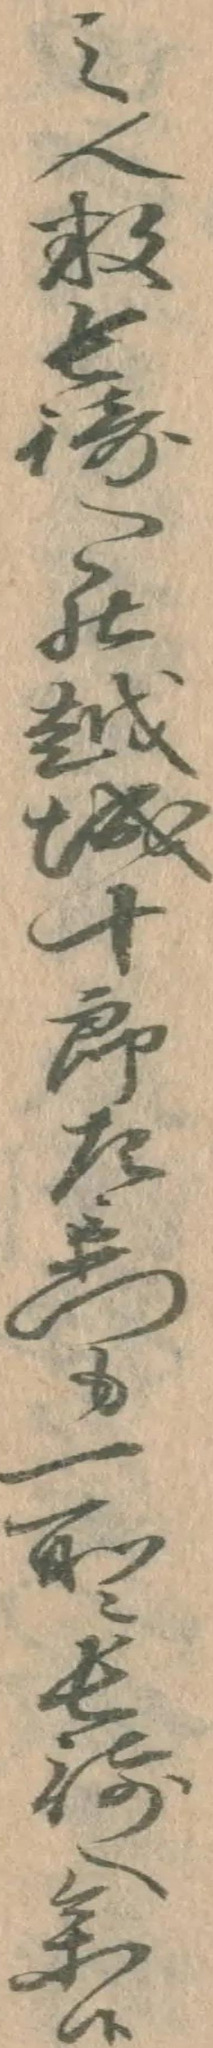之人数長崎へ罷越城十郎左衛門も一所に長崎へ参候
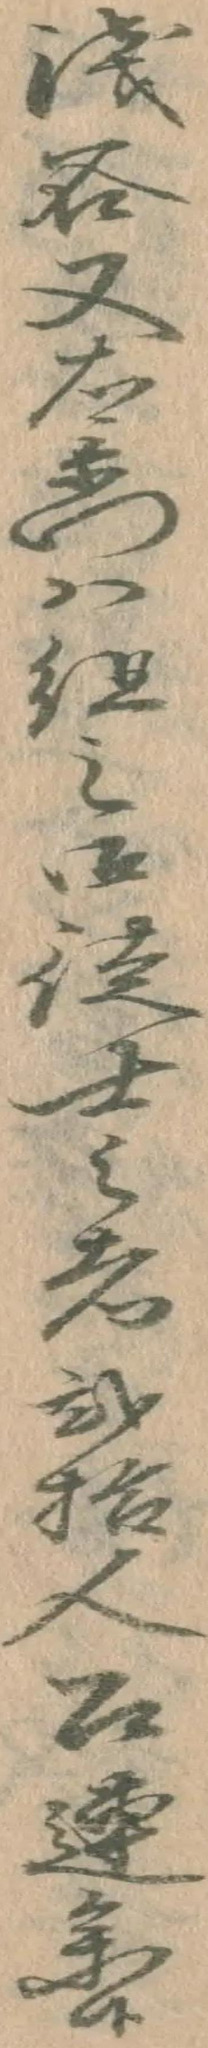浅谷又右衛門は組之御徒士之者弐拾人召連参候
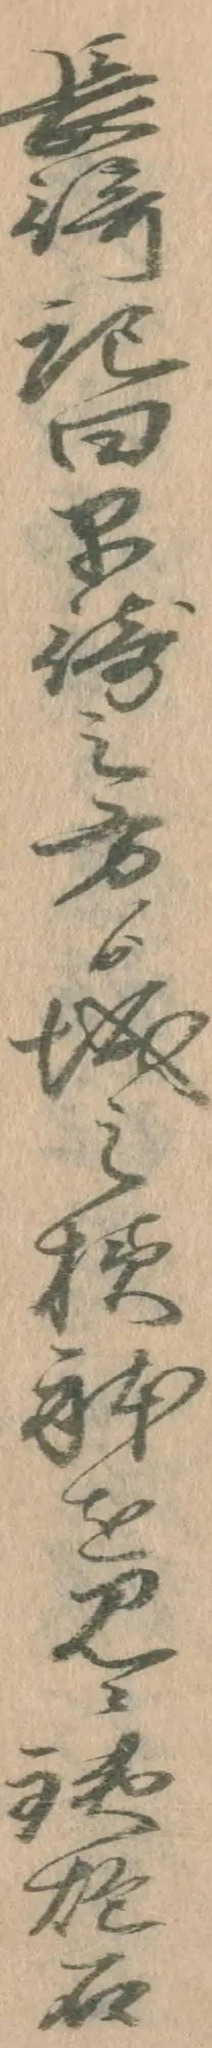長崎記曰早崎之方ゟ城之様躰を見に鉄砲石
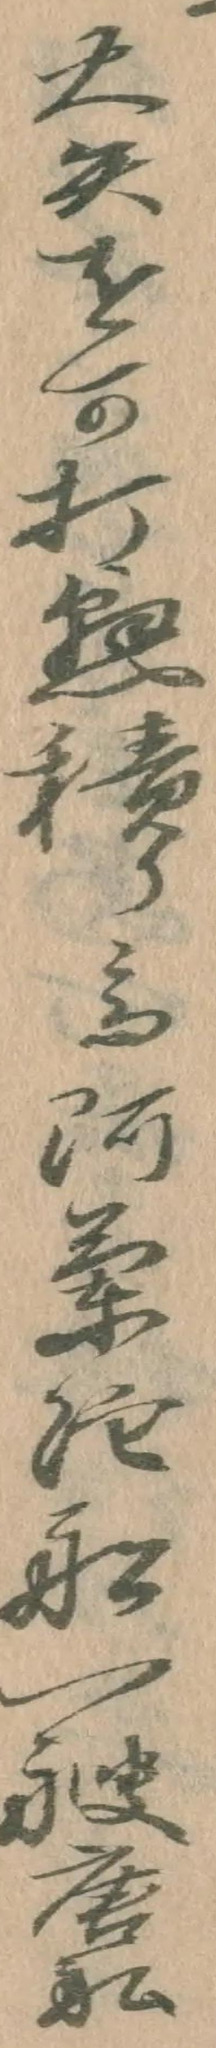火矢を可打懸積りに而阿蘭陀舩一艘唐船
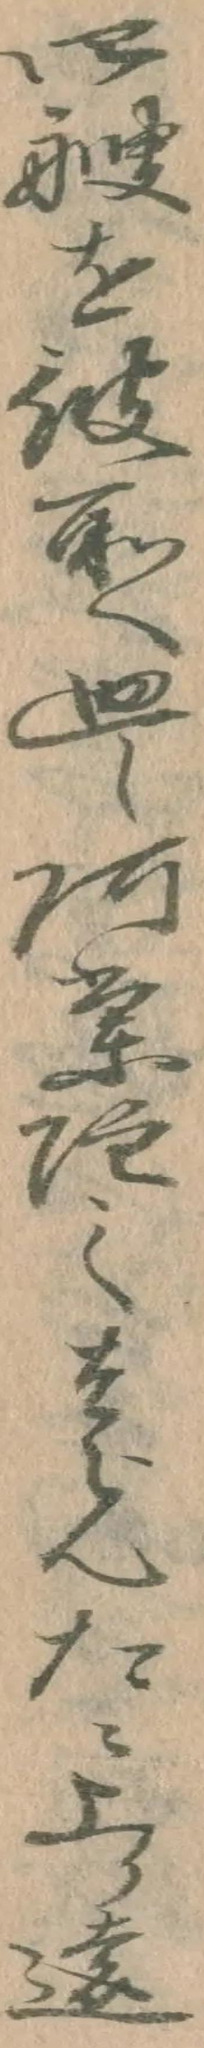四艘を彼所へ廻し阿蘭陀之はらんたに上り遠
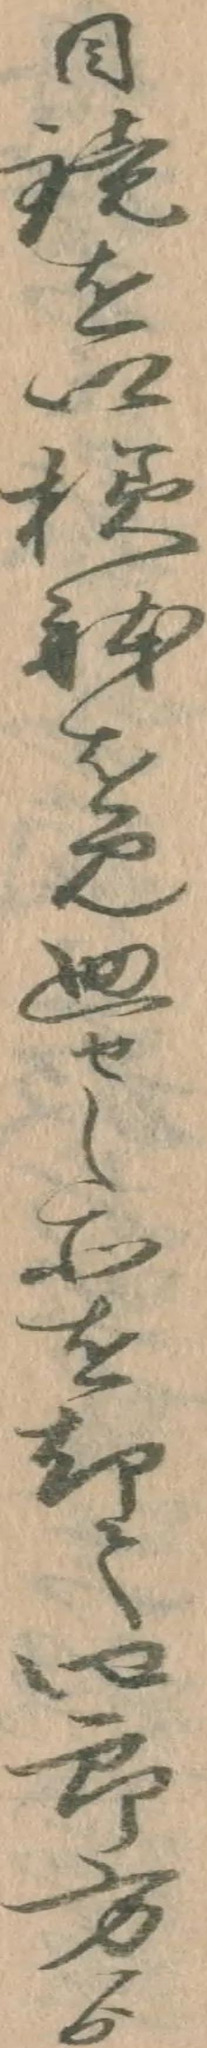目鏡を以様躰を見廻せし所を却て四郎方ゟ
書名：切支丹御退治記 49巻. [5]
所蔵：国立国会図書館 National Diet Library, JAPAN
